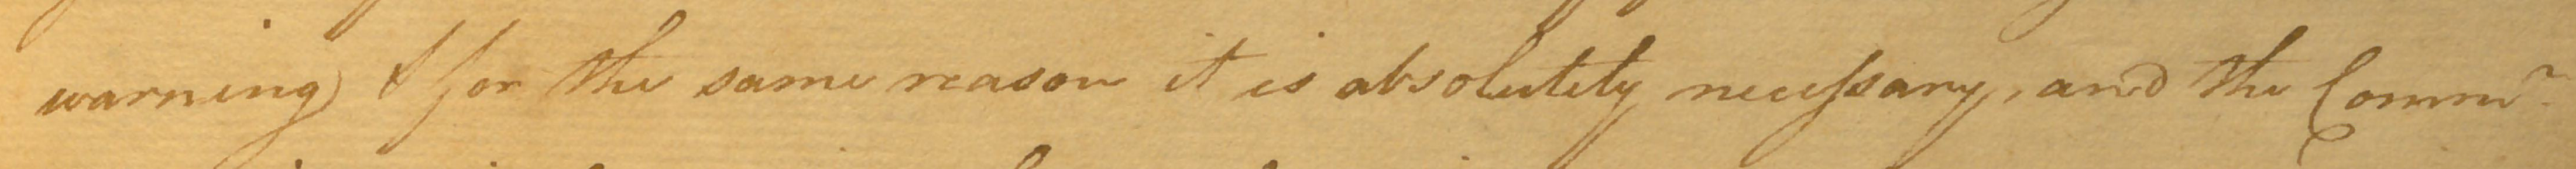warning & for the same reason it is absolutely necessary, and the Comm^r.
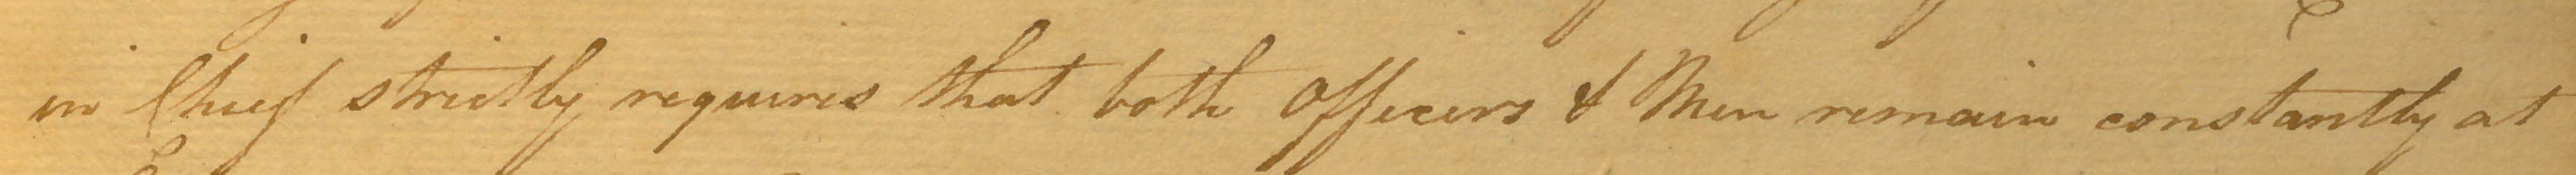in Chief strictly requires that both Officers & men remain constantly at
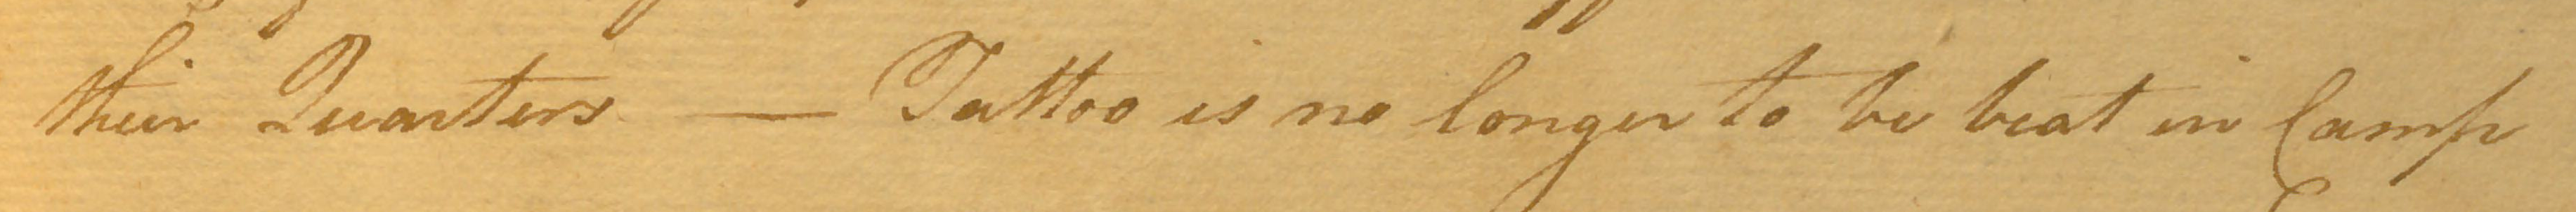their Quarters.- Tattoo is no longer to be beat in Camp
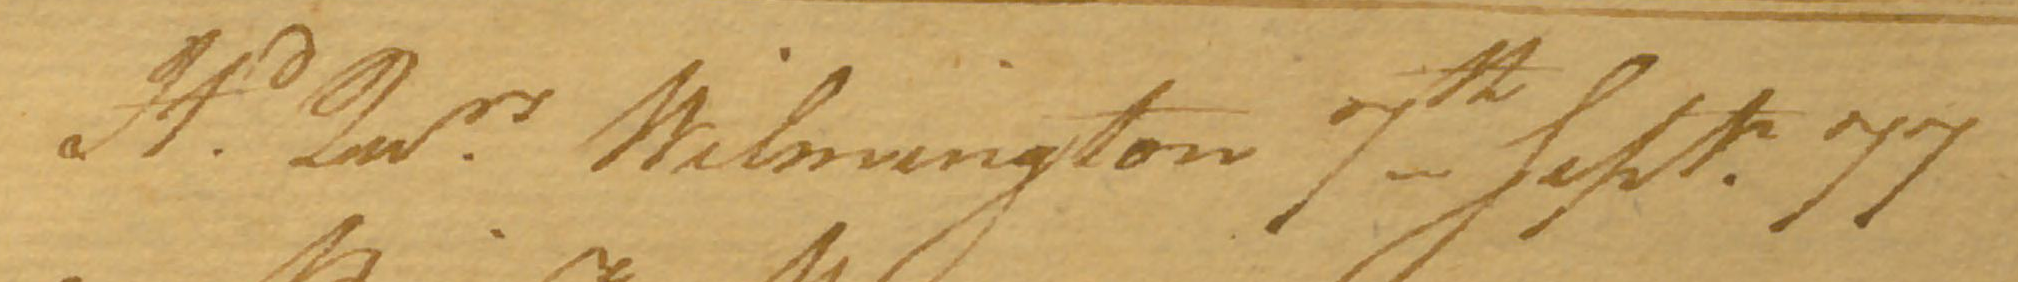H^d. Qu^rs. Wilmington 7^th. Sept^r. 77
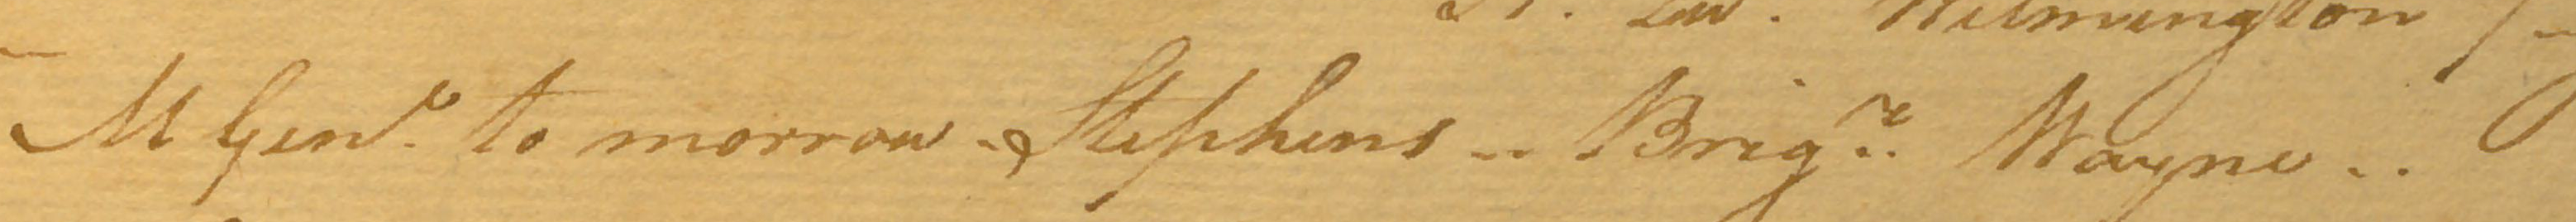M Gen^l. to morrow. Stephens.. Brig^r.. Wayne..
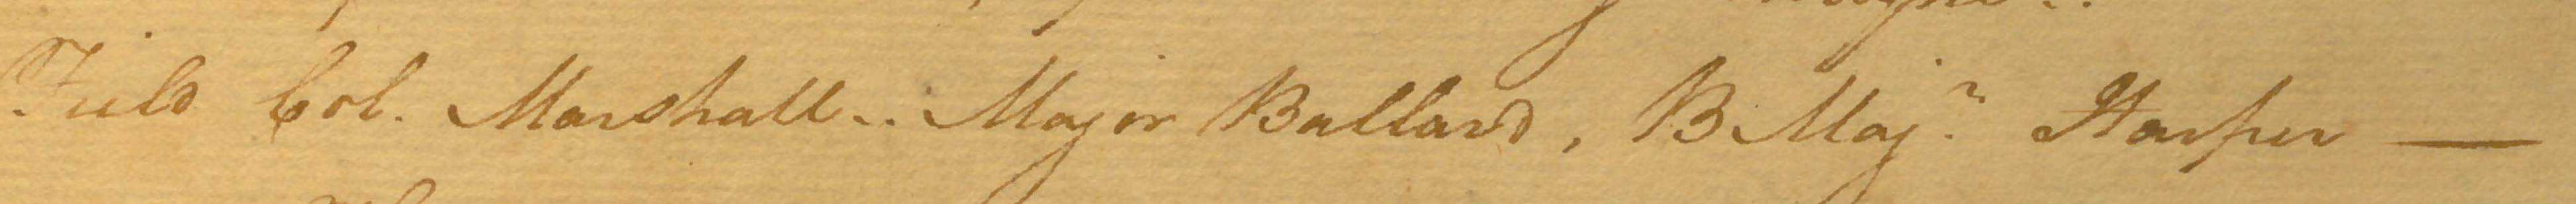Field Col. Marshall.. Major Ballard. B Maj^r. Harper-
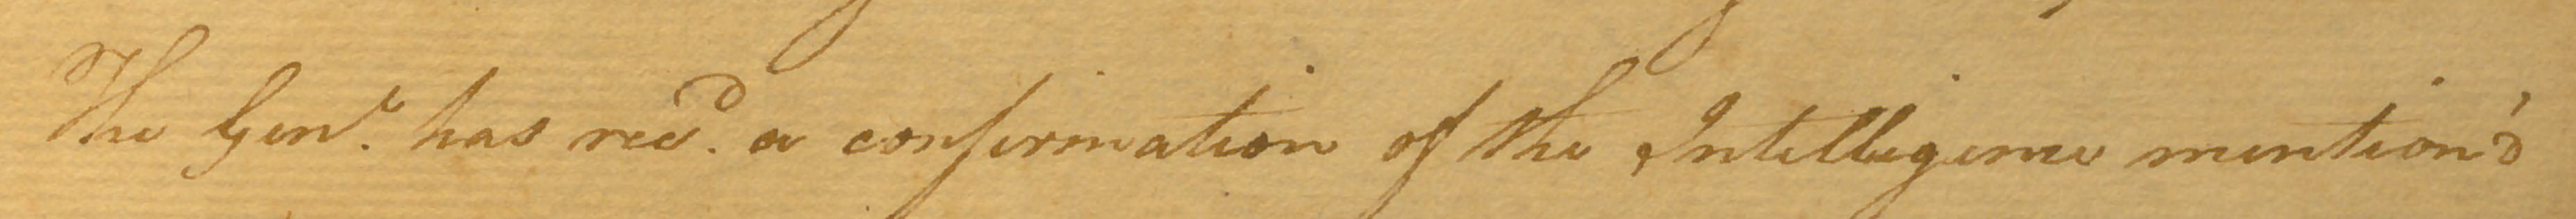The Gen^l. has rec^d. a confirmation of the Intelligence mention'd
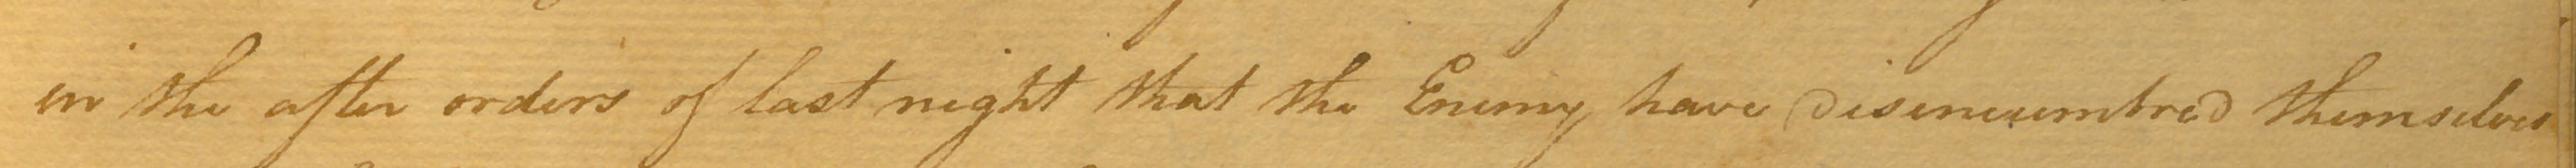in the after orders of last night that the Enemy have disencumbred themselves
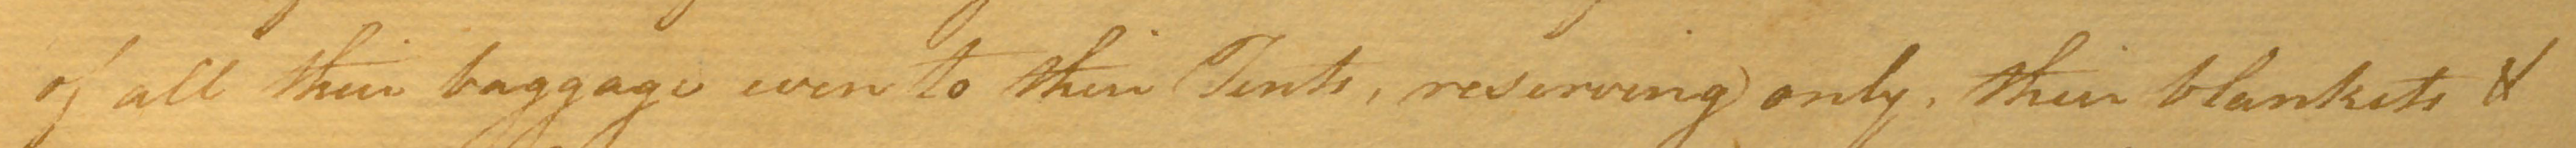of all their baggage of all their baggage even to their Tents, reserving only their blankets &
